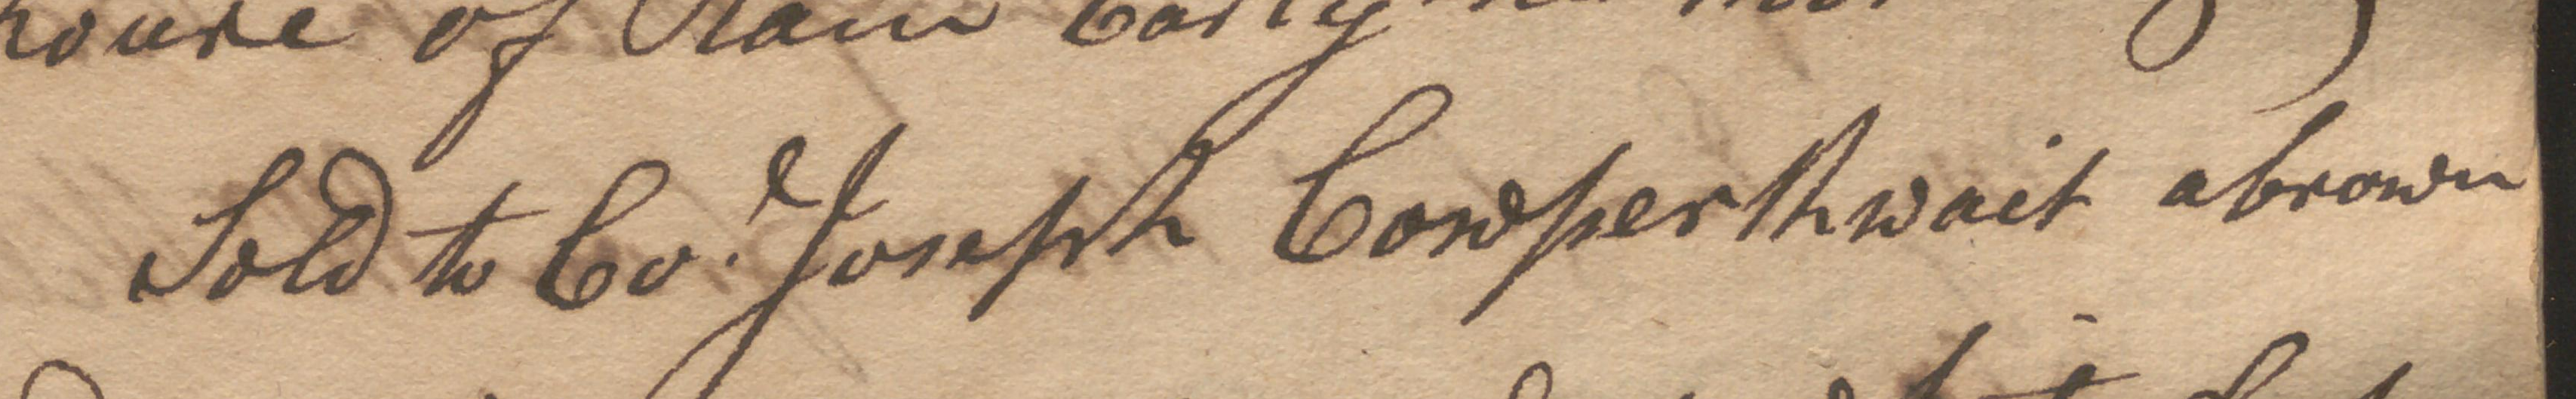Sold to Co^l. Joseph Cowperthwait a brown
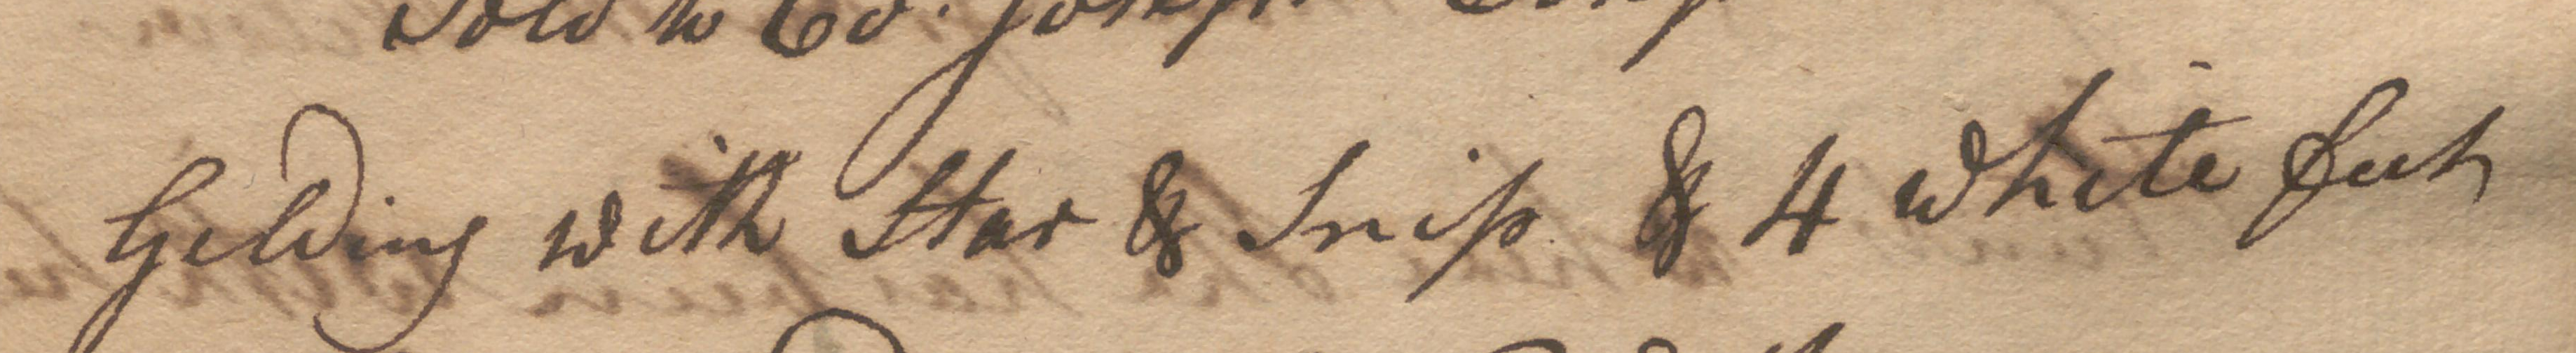Gelding with star & Snip & 4 white feet
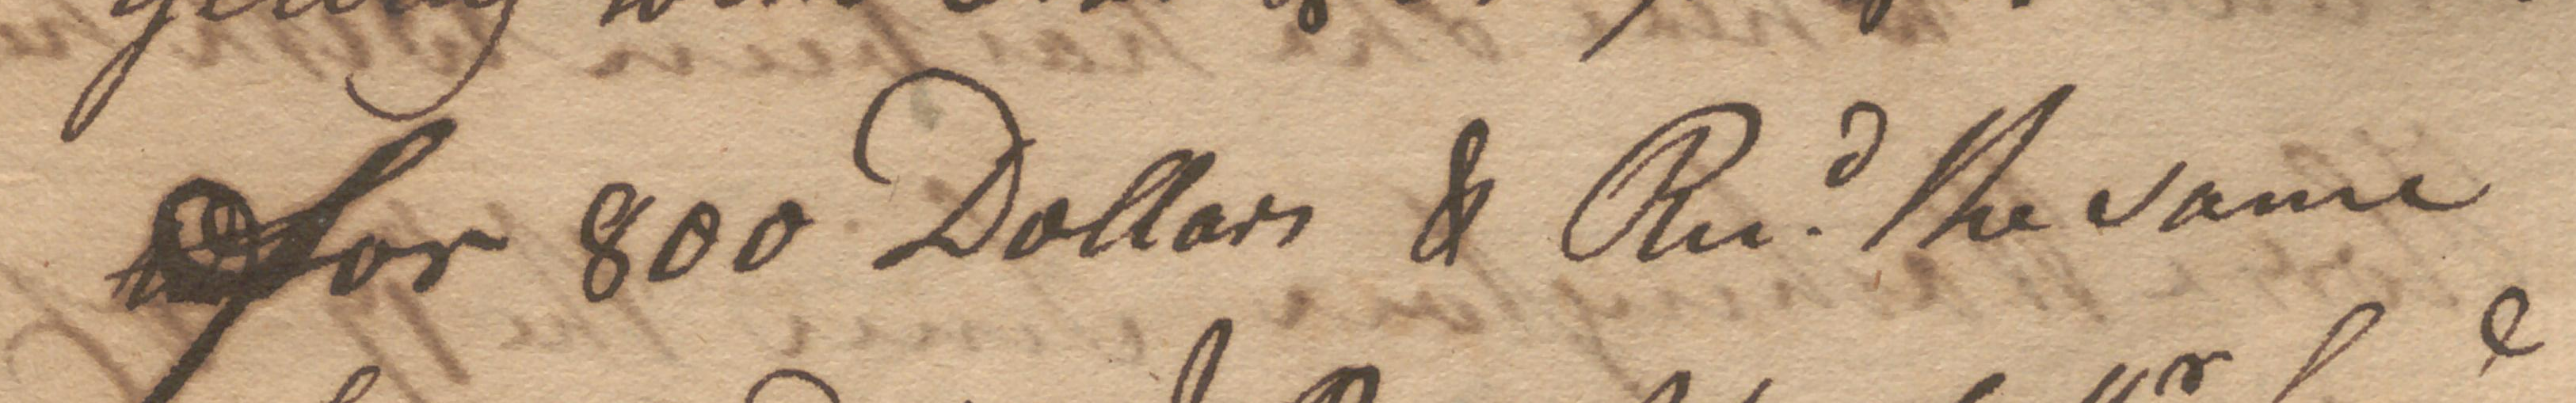for 800 Dollars & Rec^d. the same
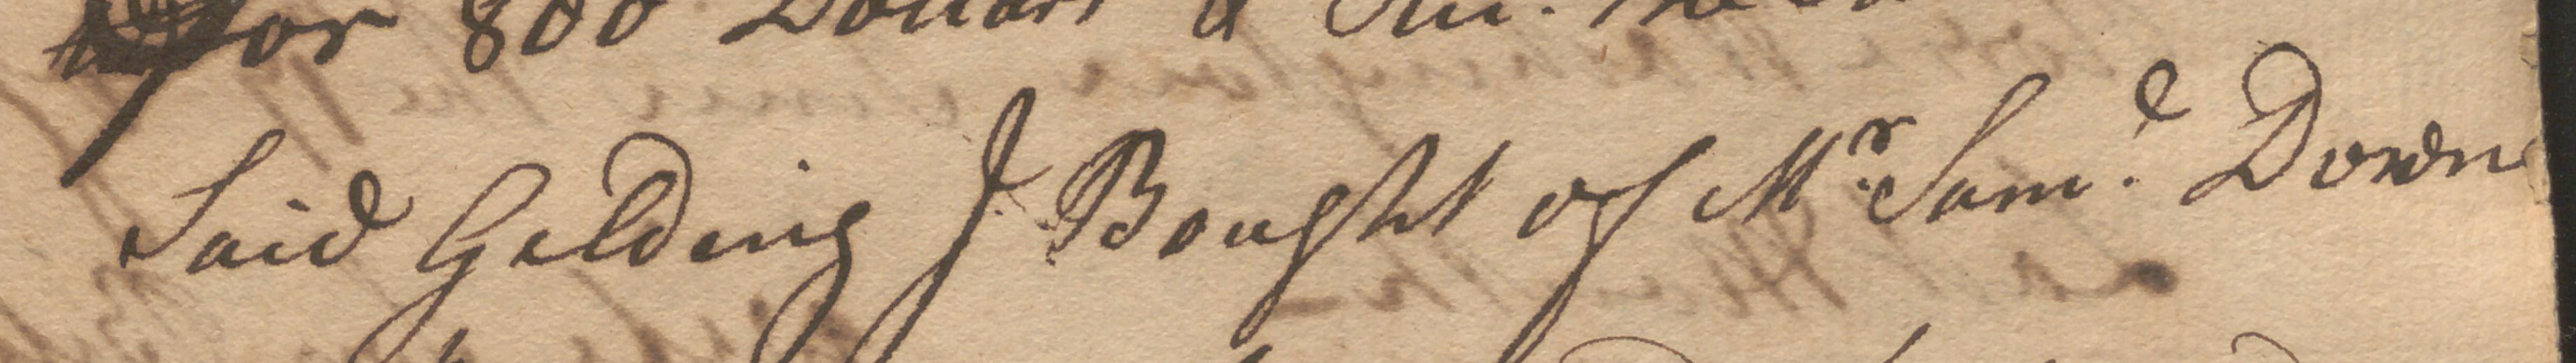Said Gelding J Bought of M^r Sam^l. Down
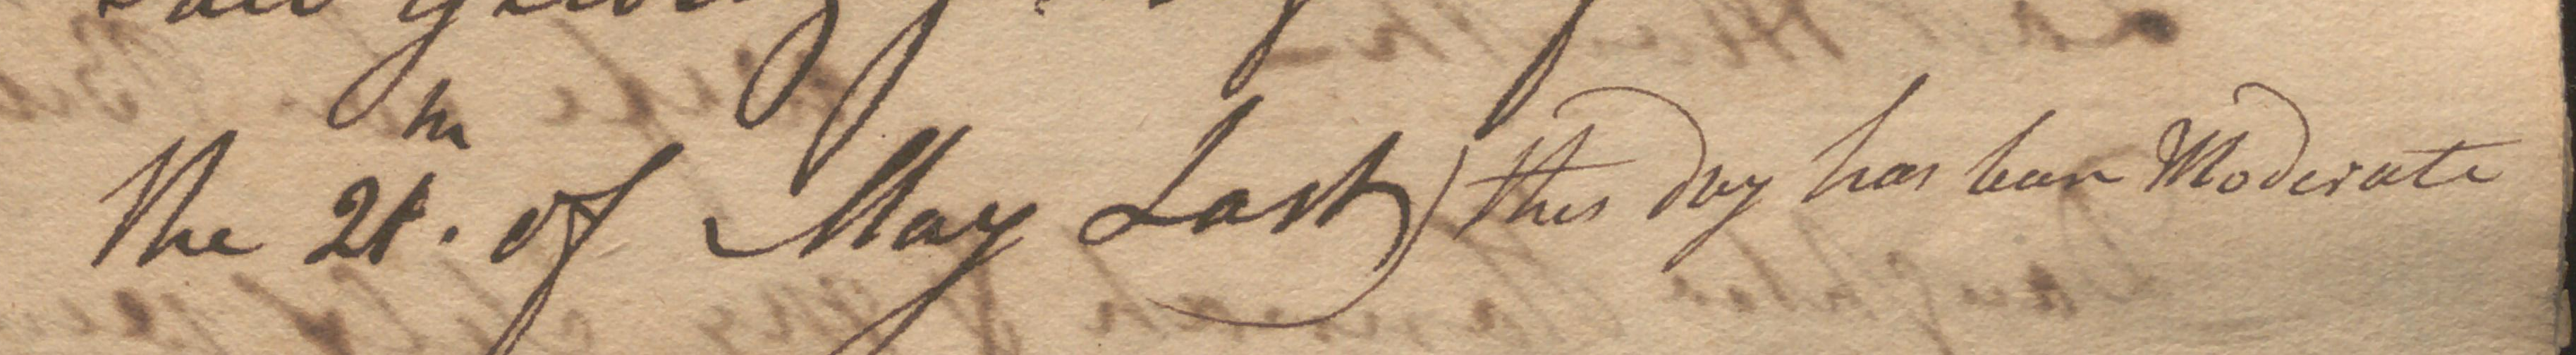the 21^th. of May Last this day has been Moderate
